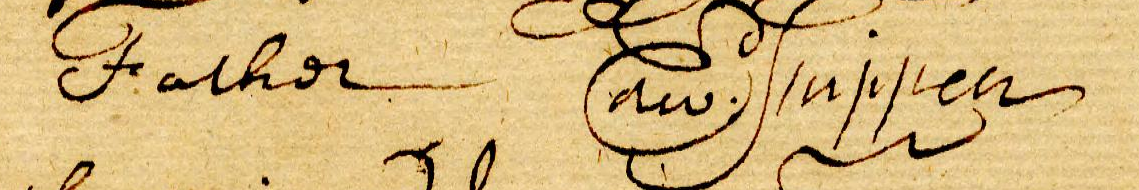Father Edw. Shippen
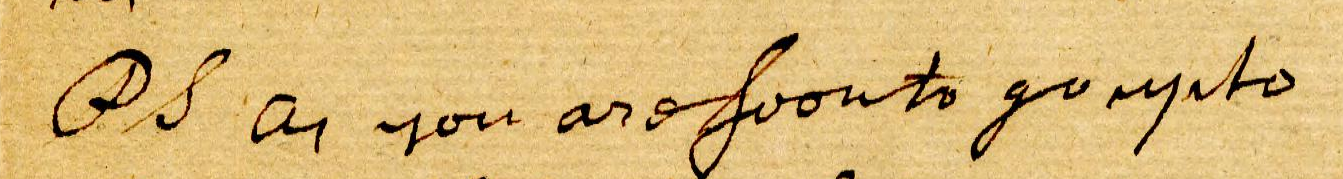PS As you are soon to go into
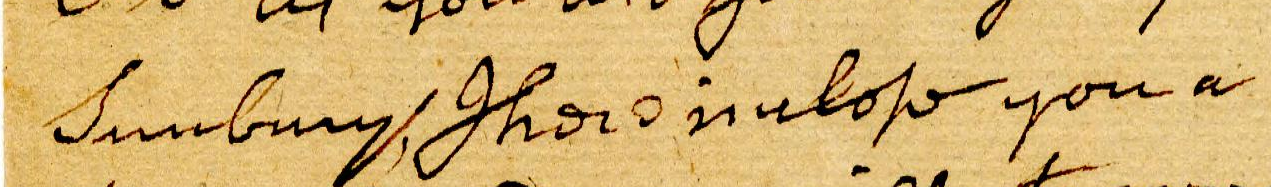Sunbury, I here inclose you a
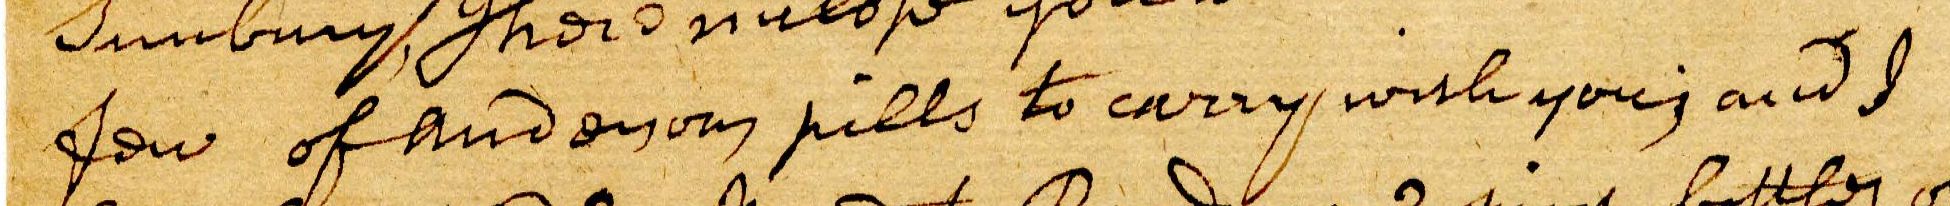few of Andersons pills to carry with you; and I
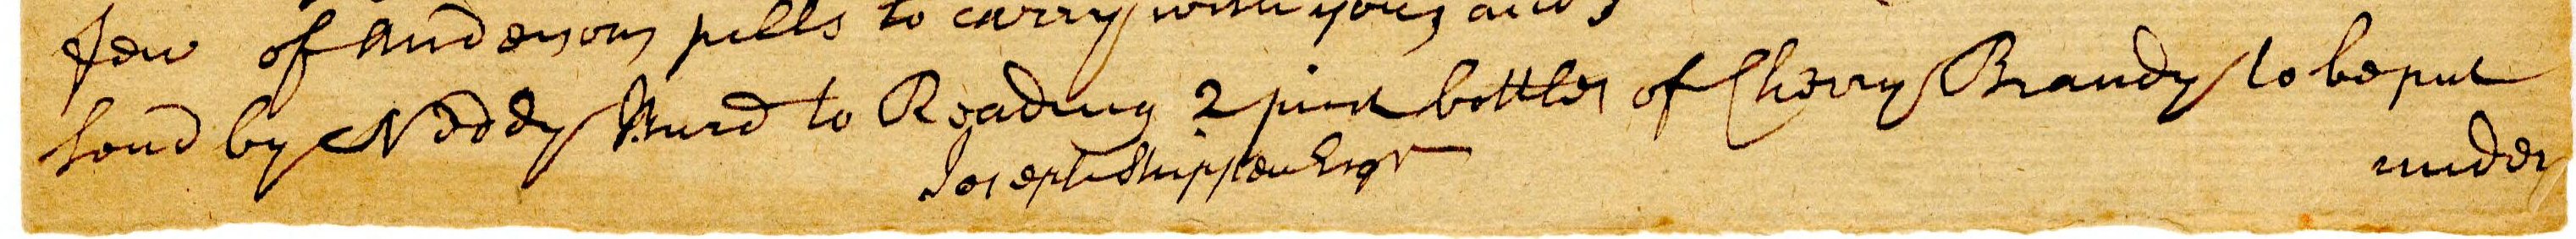send by Neddy Burd to Reading 2 pint bottles of Cherry Brandy to be put
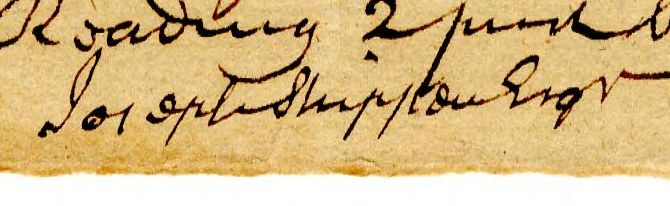Joseph Shippen Esq^r
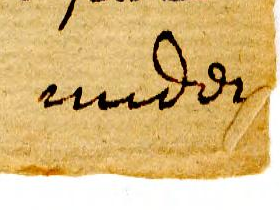under
